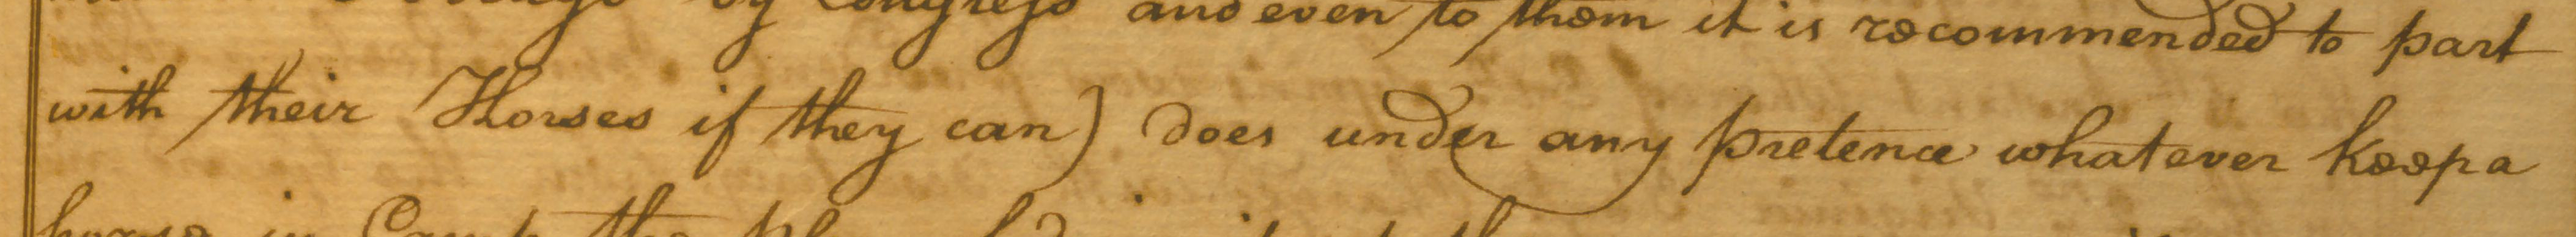with their Horses if they can) does under any pretence whatever keep a
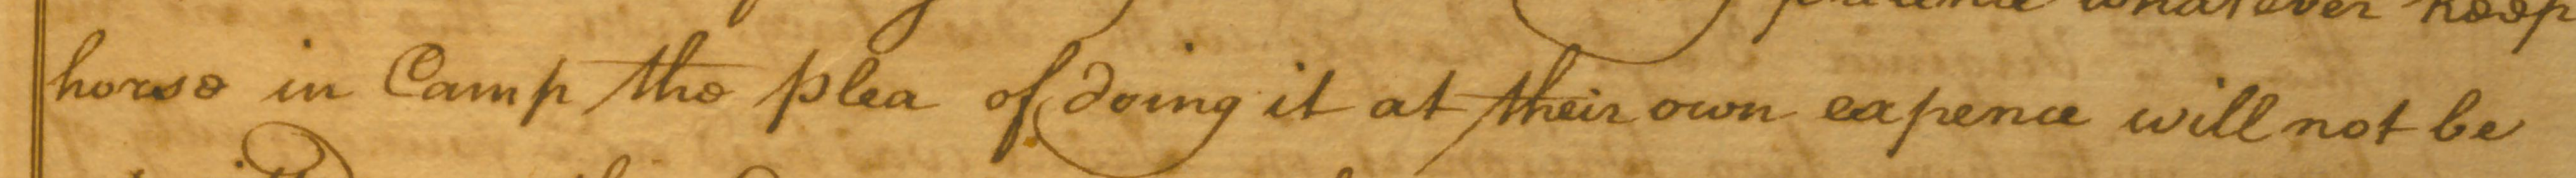horse in Camp the plea of doing it at their own expence will not be
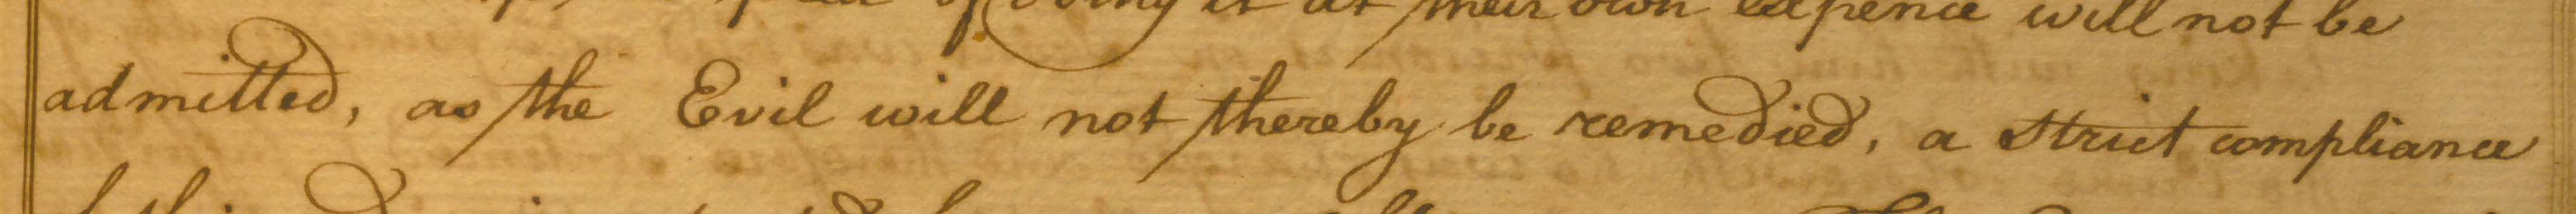admitted, as the Evil will not thereby be remedied, a strict compliance
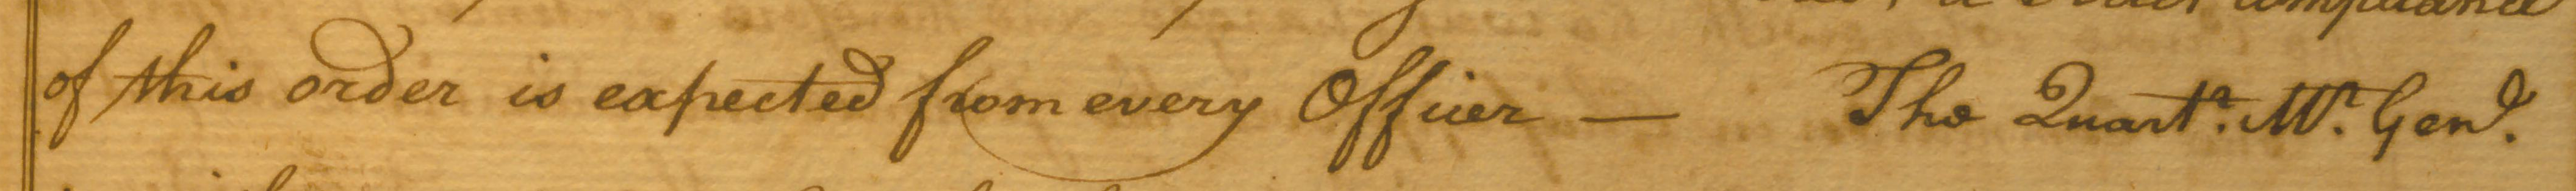of this order is expected from every Officer- The Quart^r. M^r. Gen^l.
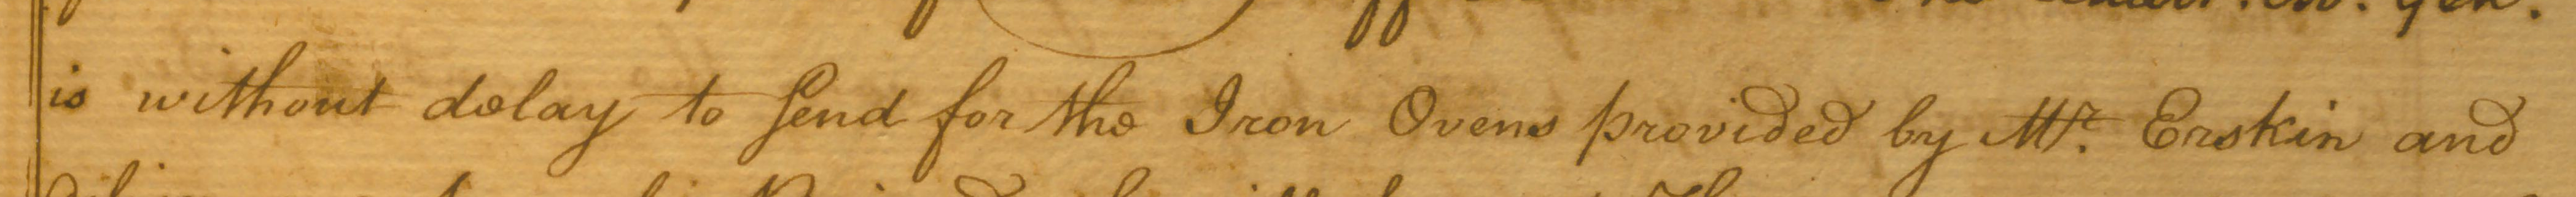is without delay to Send for the Iron Ovens provided by M^r. Erskin and
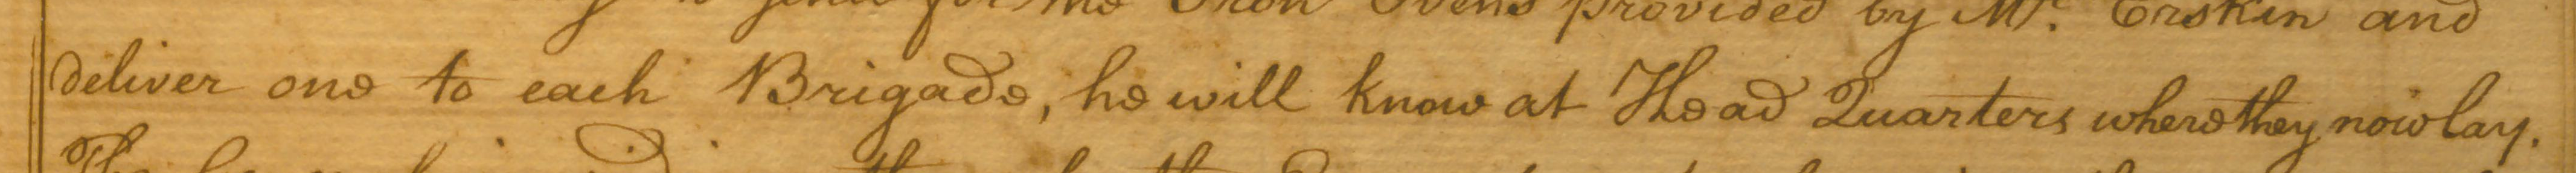deliver one to each Brigade, he will know at Head Quarters where they now lay.
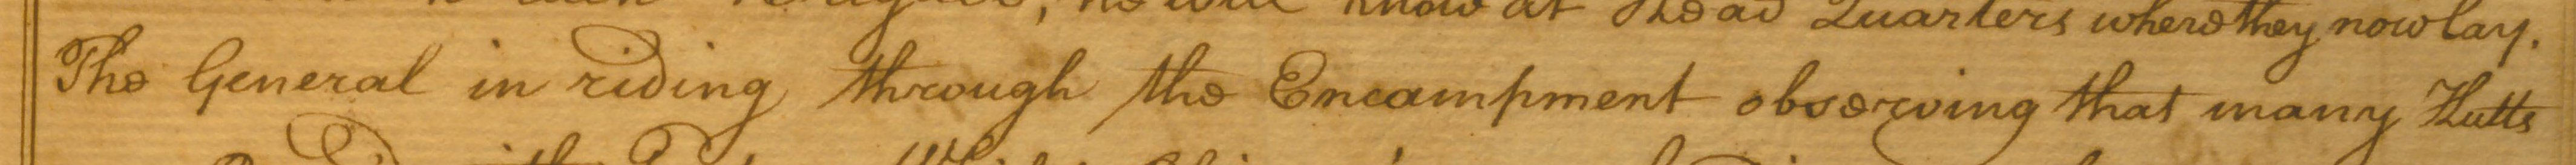The General in riding through the Encampment observing that many Hutts
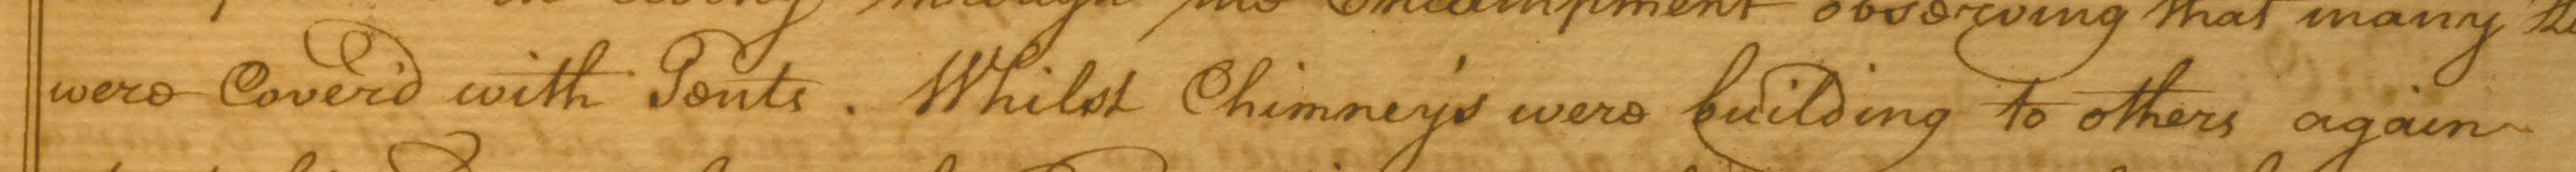were Cover'd with Tents. Whilst Chimney's were building to others again
